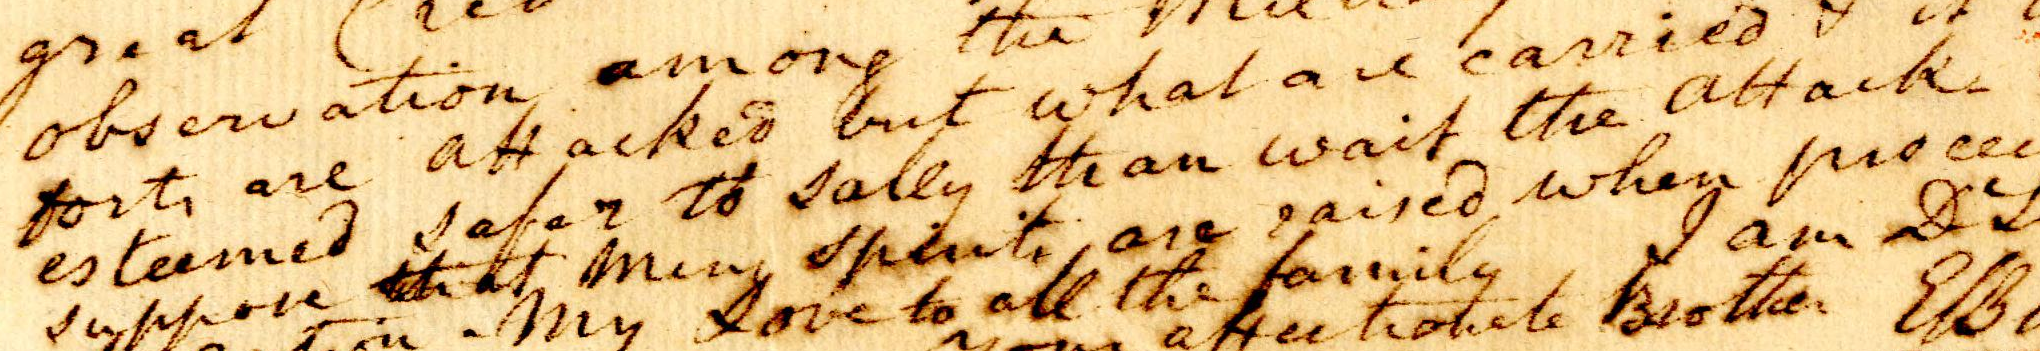esteemed safer to sally than wait the Attack. I
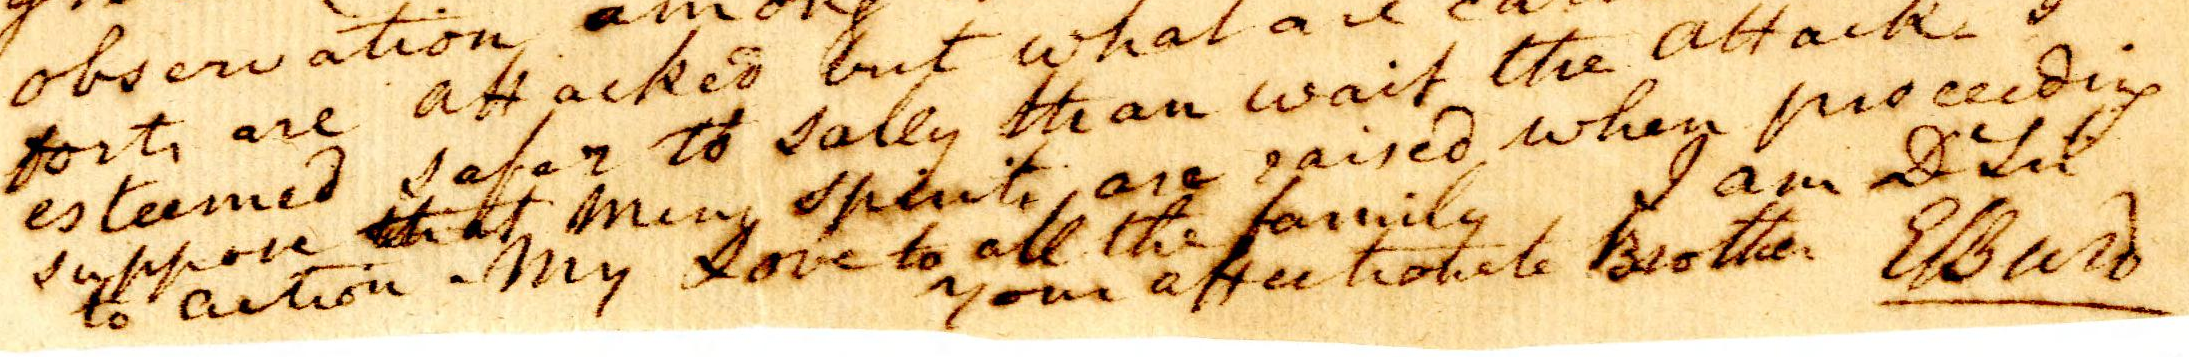suppose that Mens Spirits are raised when proceeding
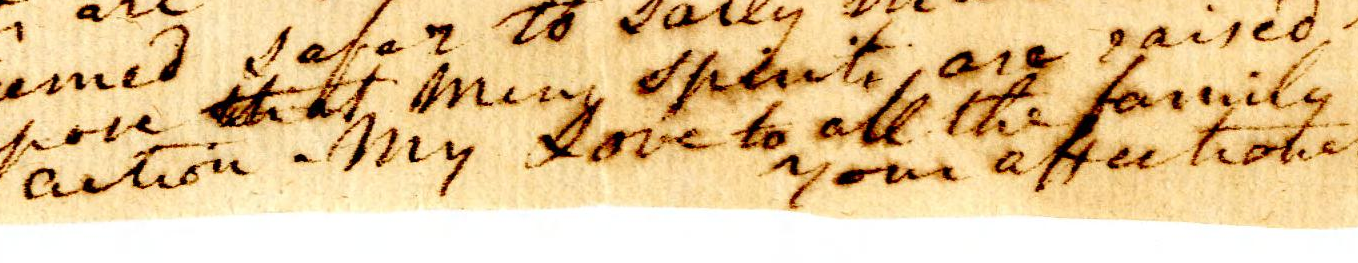to action. My Love to all the family
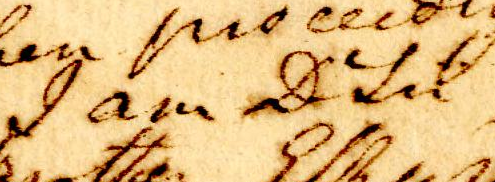I am D^r Sir
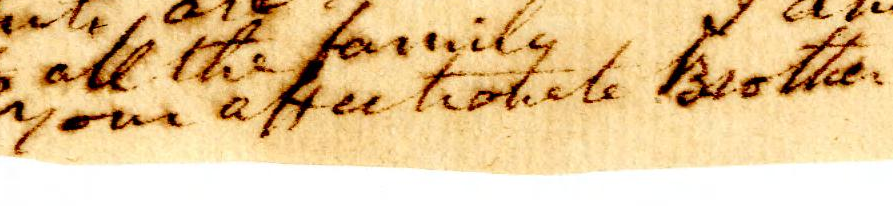your affectionate Brother
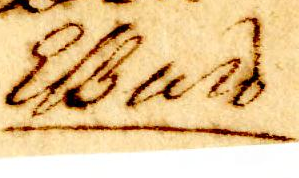E. Burd
